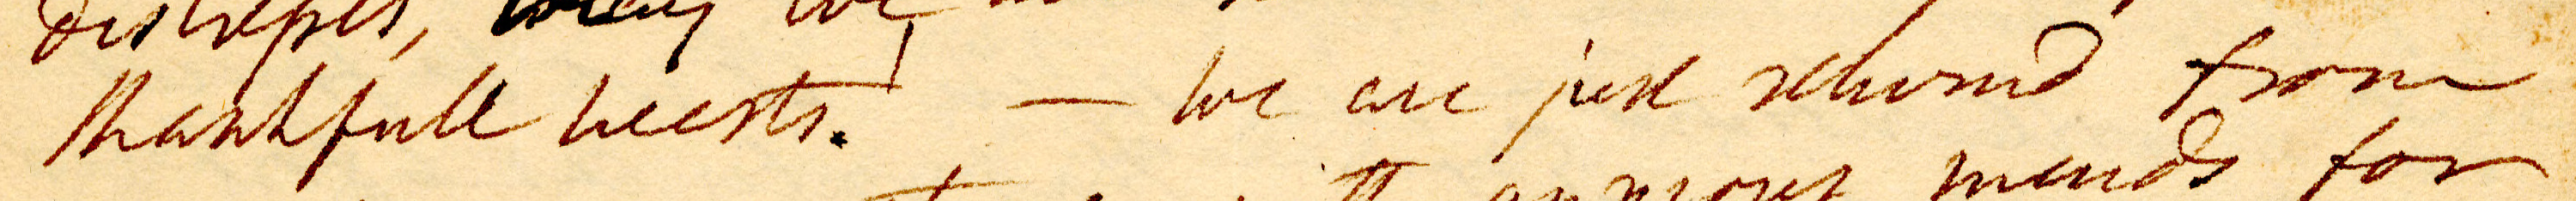thankfull hearts.- We are just returnd from
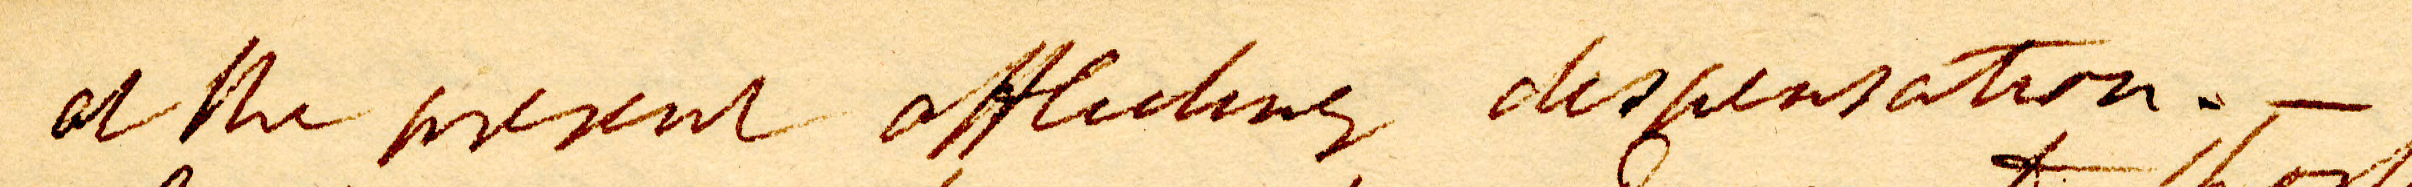at the present affecting dispensation.-
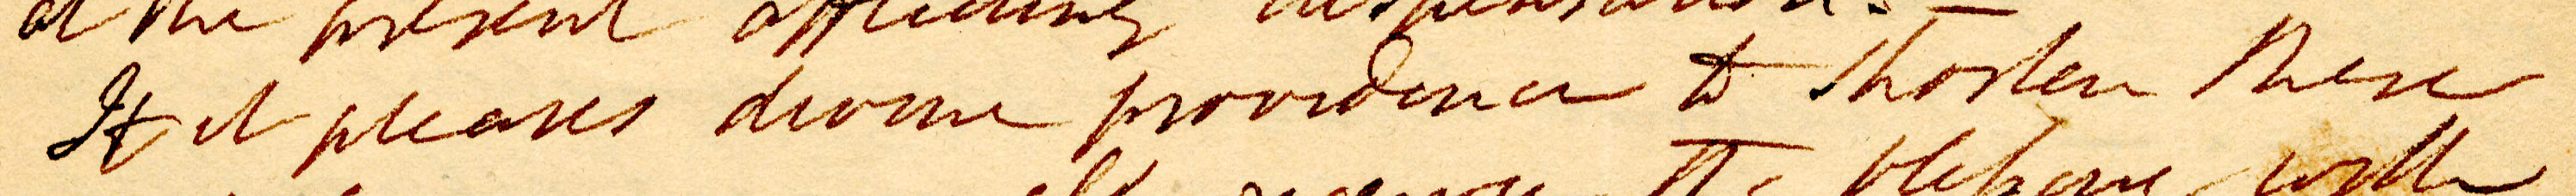If it pleases divine providence to shorten these
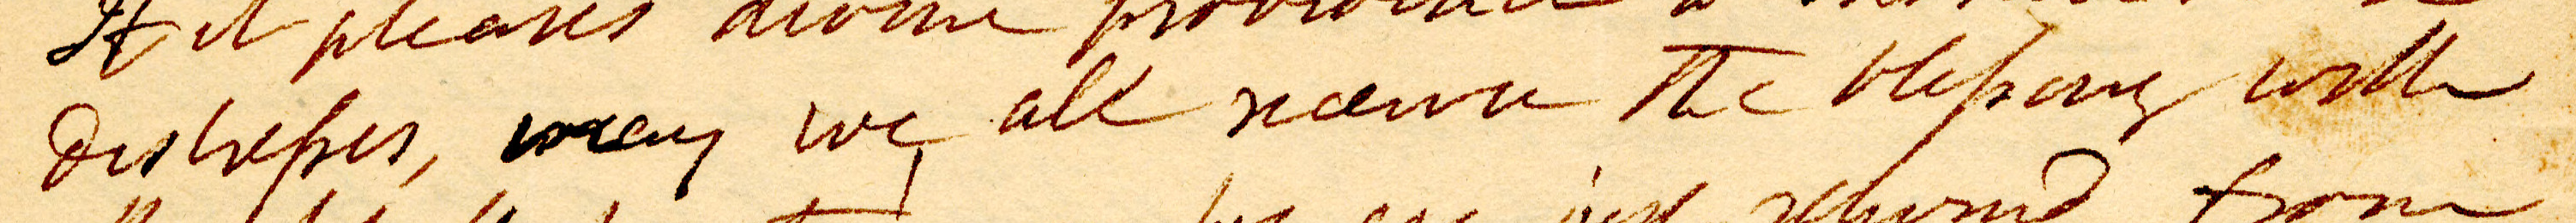distresses, may we all receive The blessing with
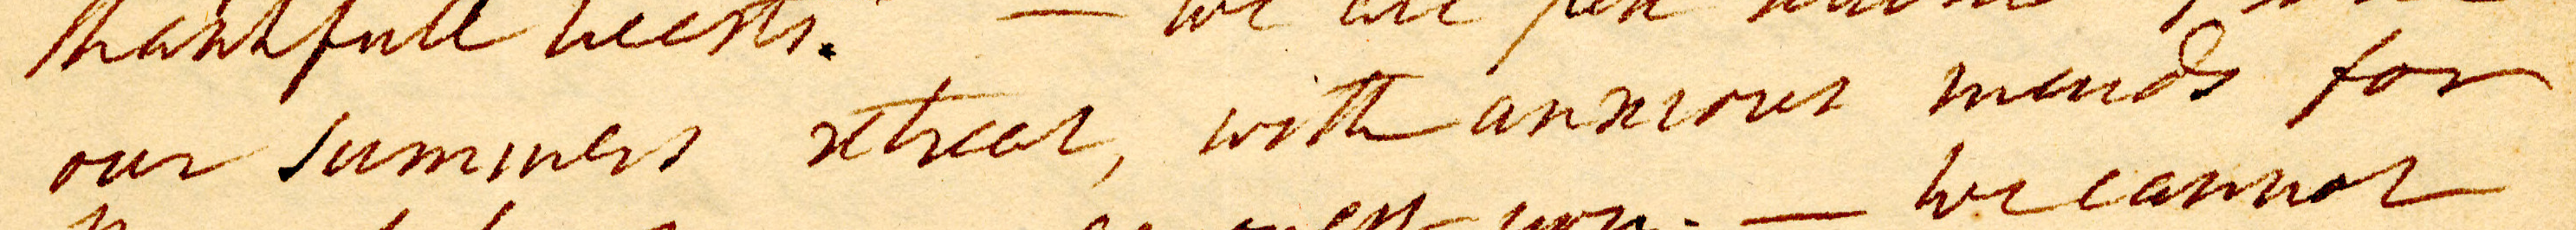our summers retreat, with anxious minds for
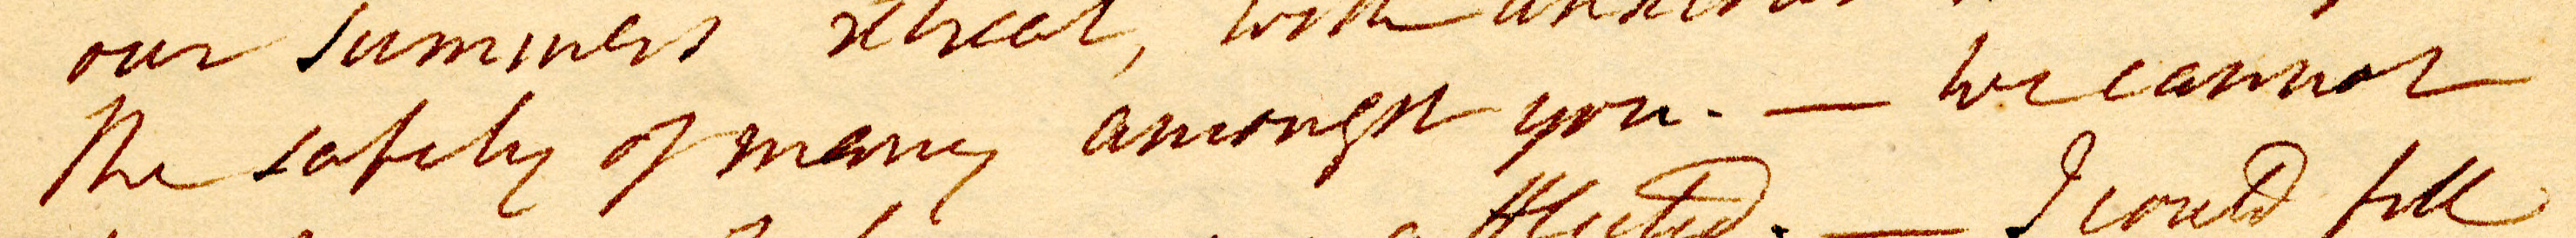the safety of many amongst you.- We cannot
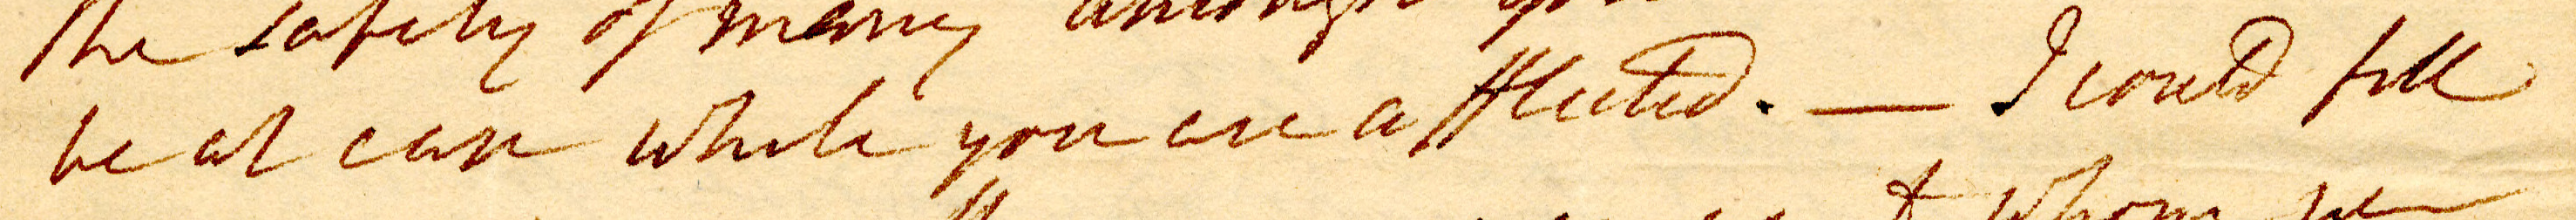be at ease while you are affected.- I could fill
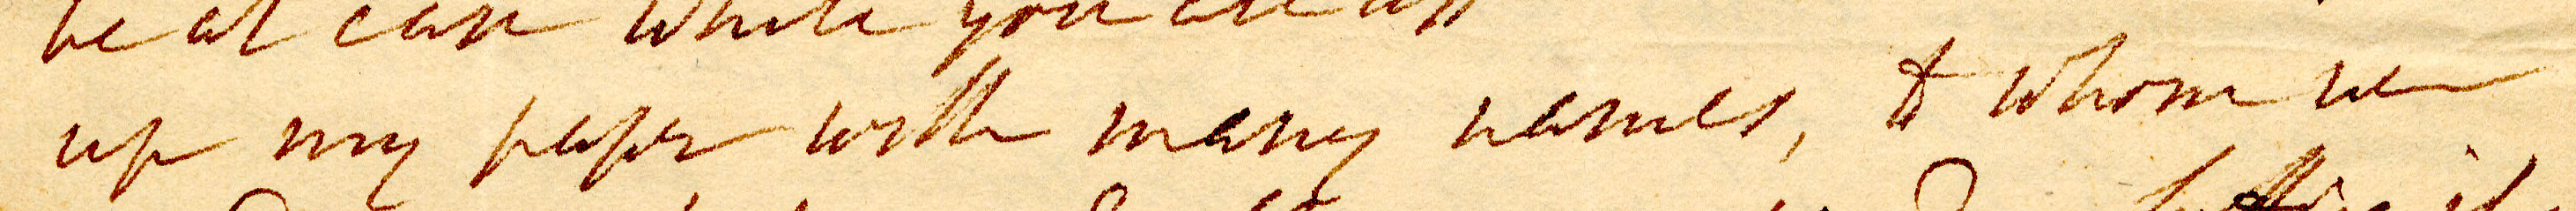up my paper with many names, to whom we
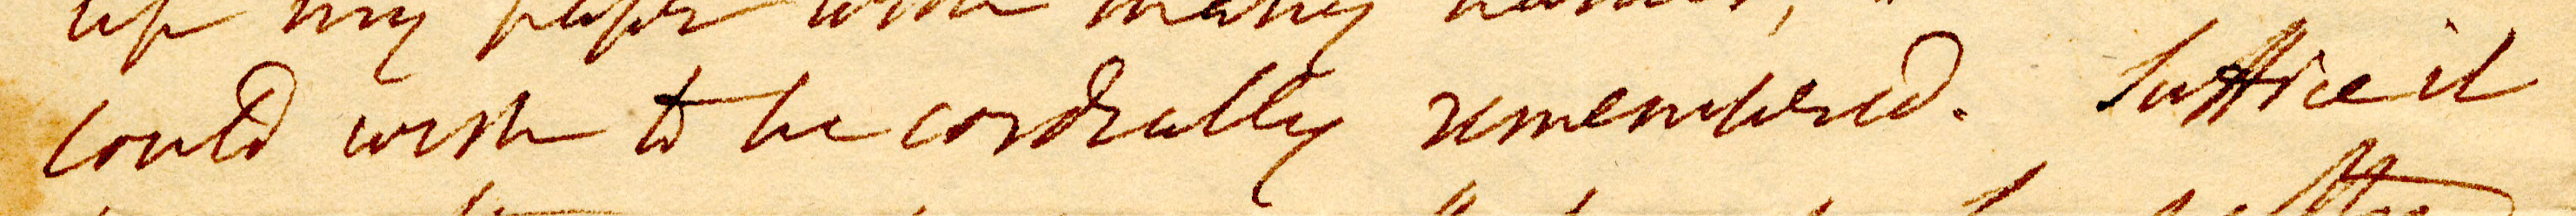could wish to be cordially remembered. Suffice it
